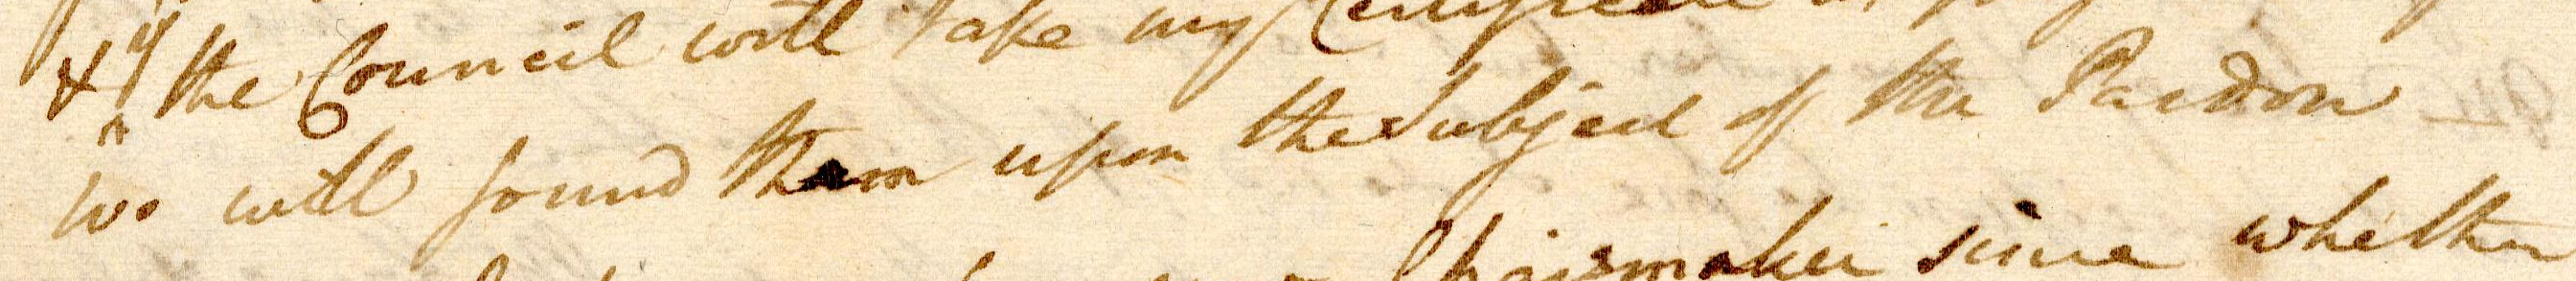we will found them upon the Subject of the Pardon.
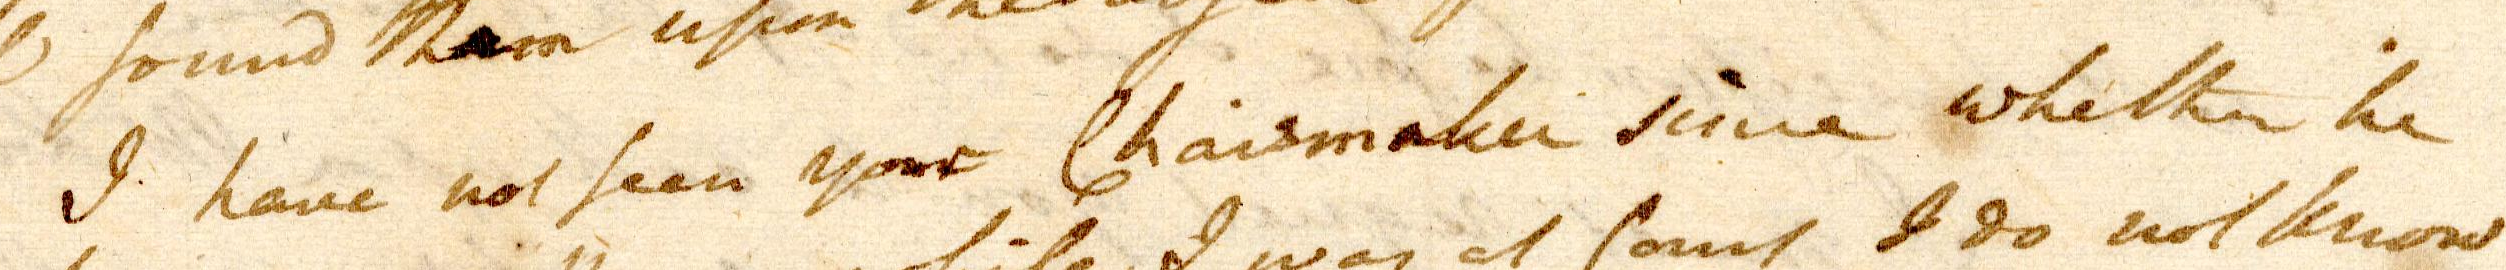I have not seen your Chairmaker since whether he
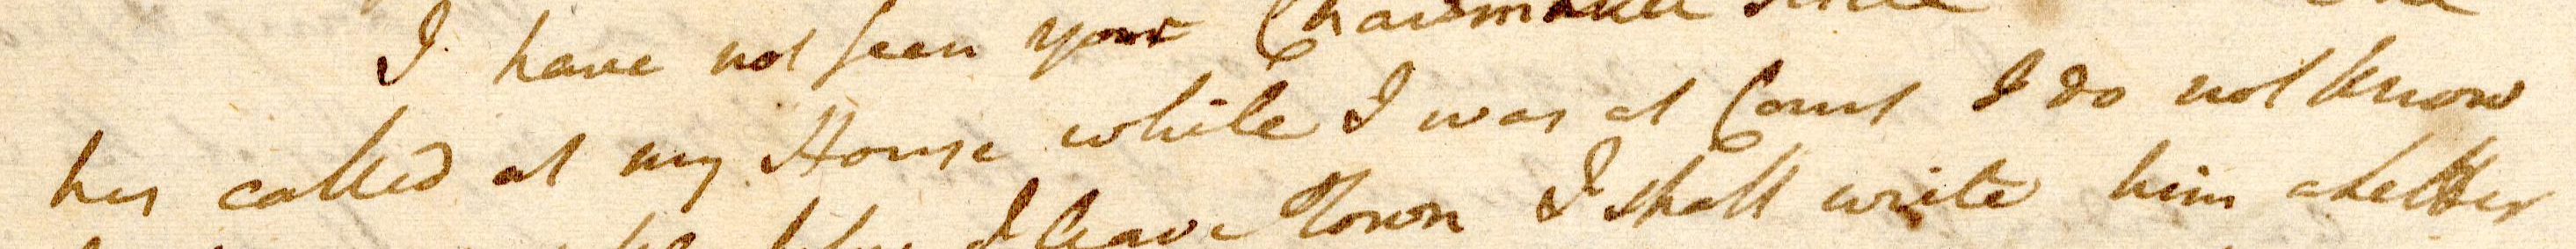has called at my House while I was at Court & do not know
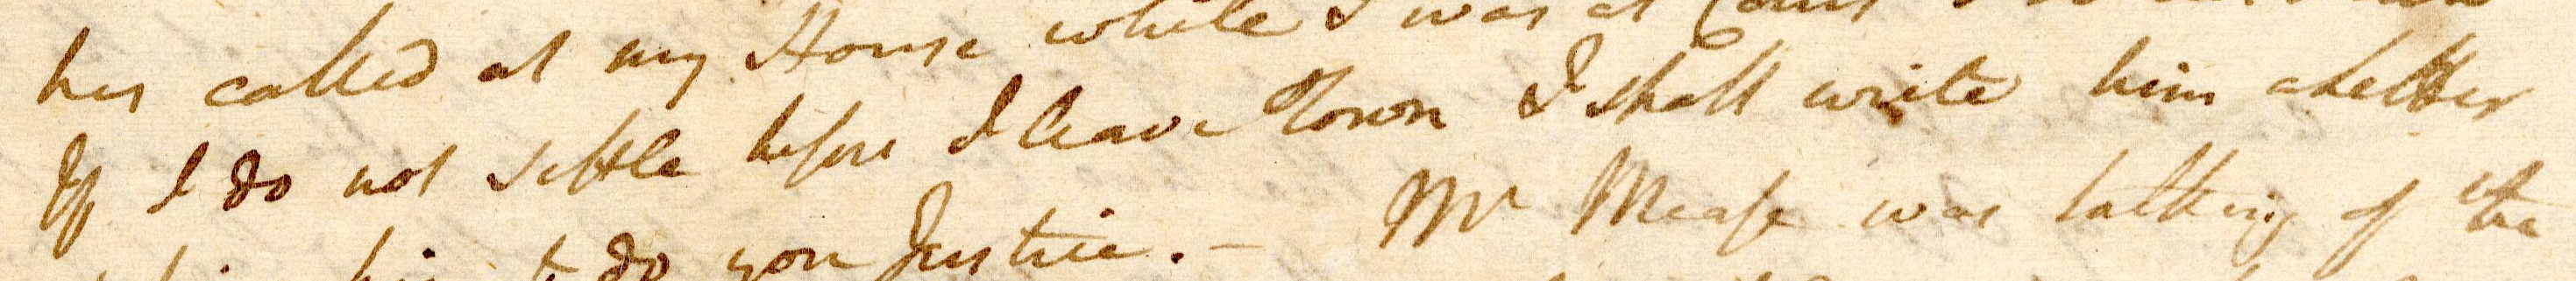If I do not settle before I leave town I shall write him a Letter
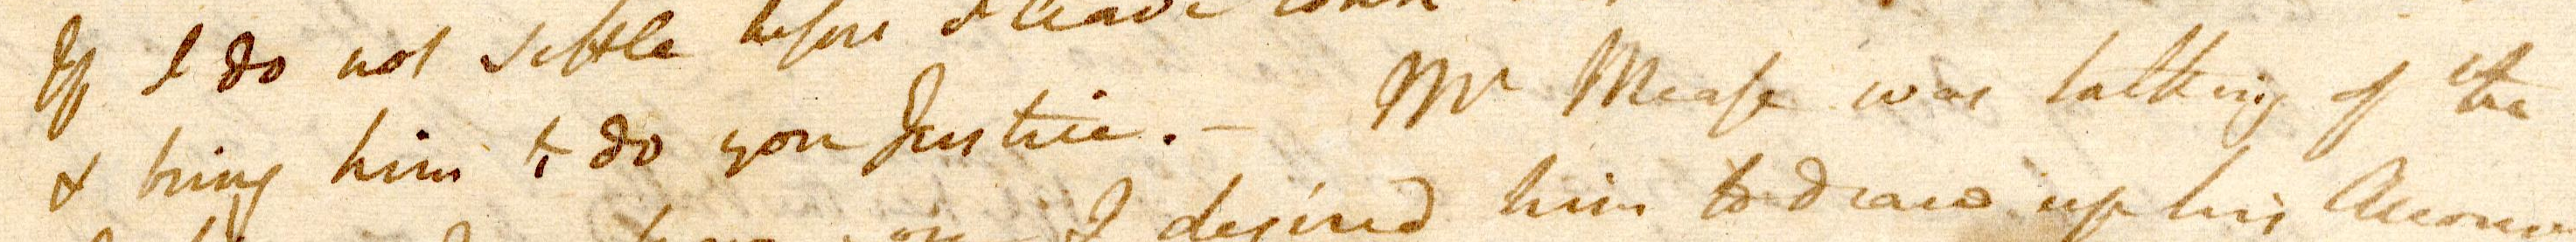& bring him do you Justice. M^r Mease was talking of the
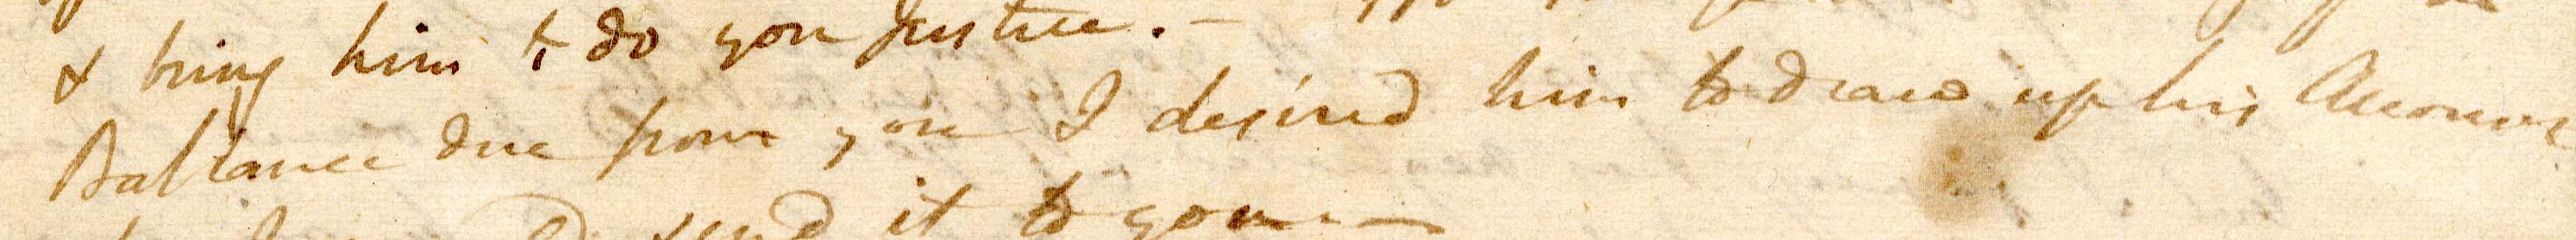Ballance due from you I desired him to draw up his Account
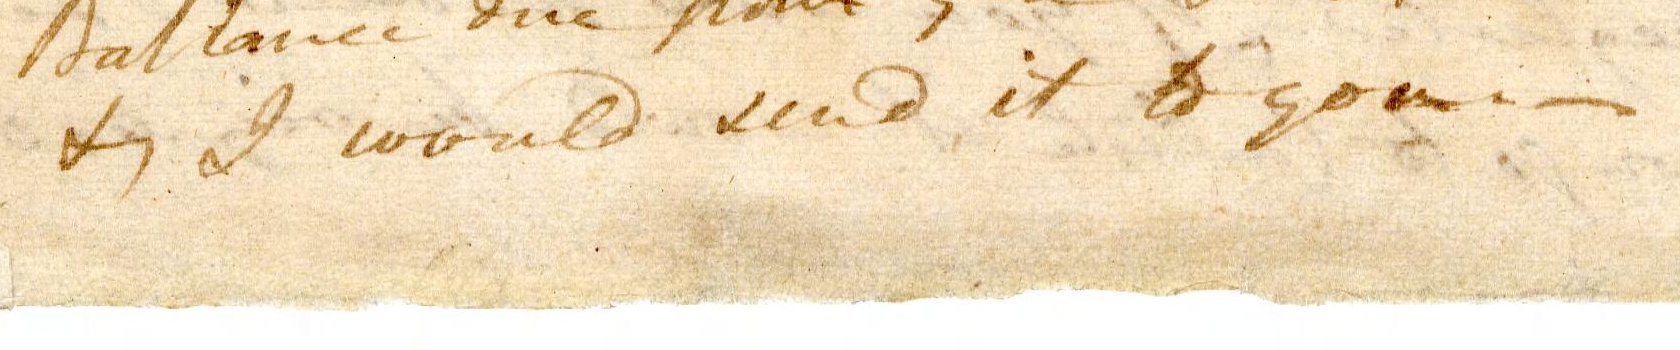& I would send it to you.
